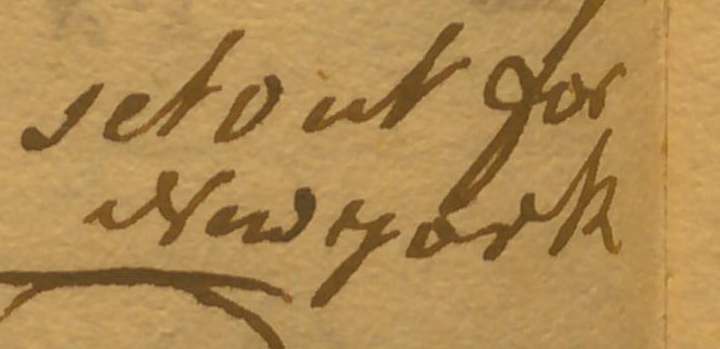New york
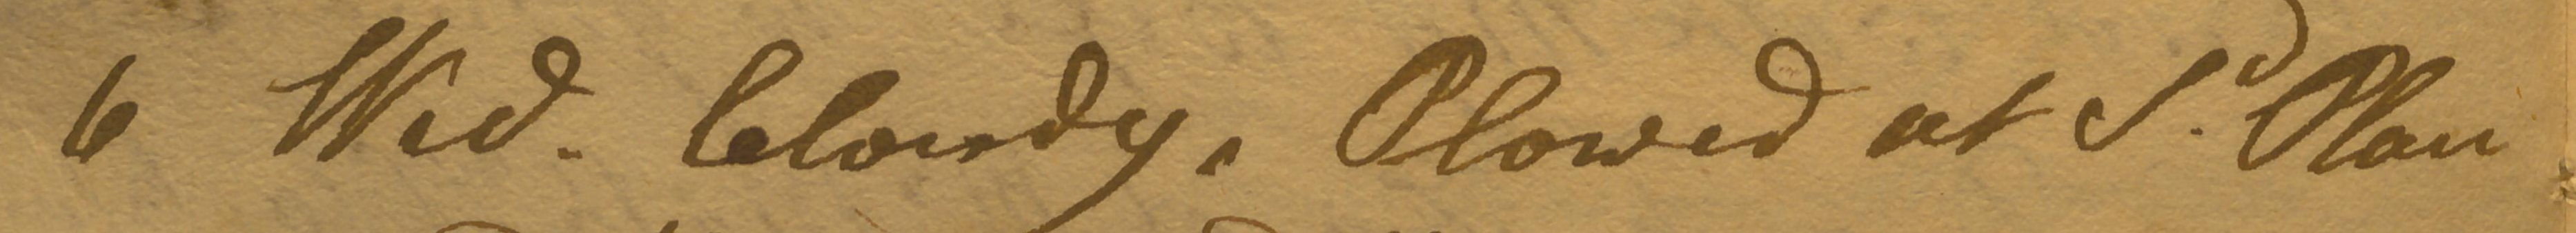6 Wed. Cloudy. Plowed at s^d. Plan
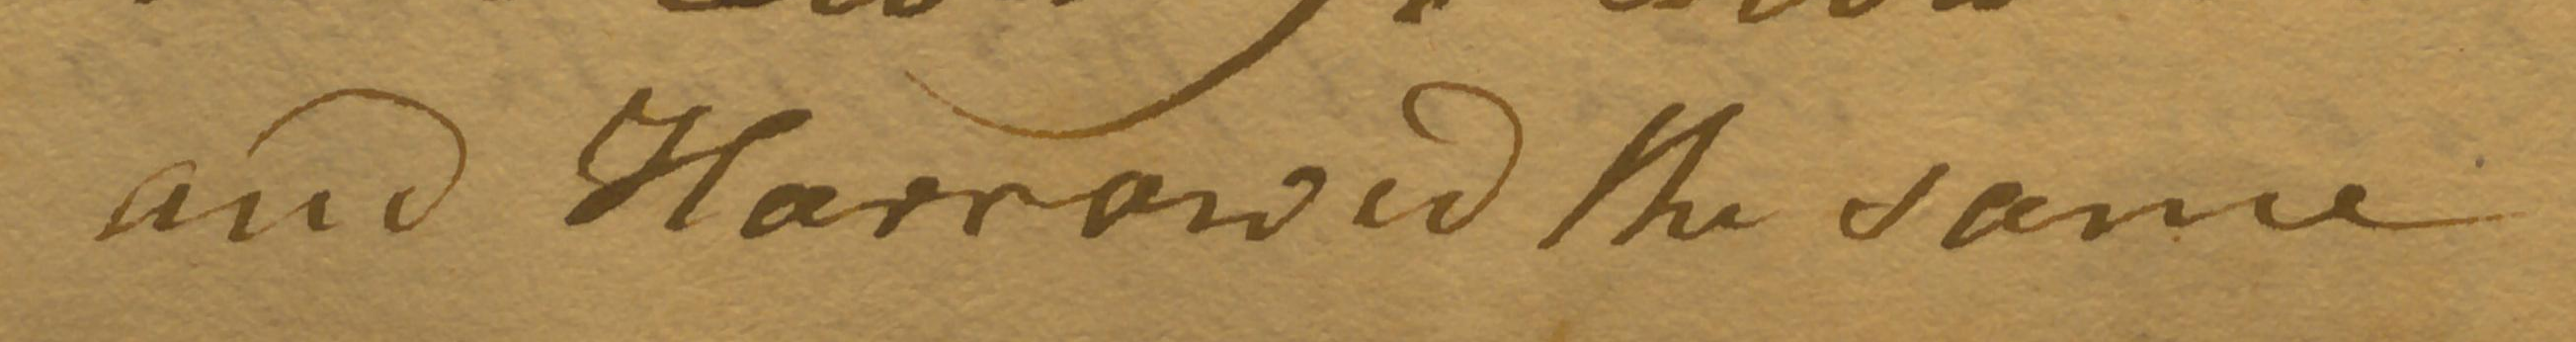ane Harrowed the same
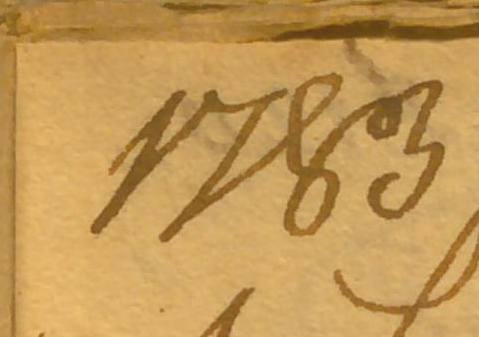1783
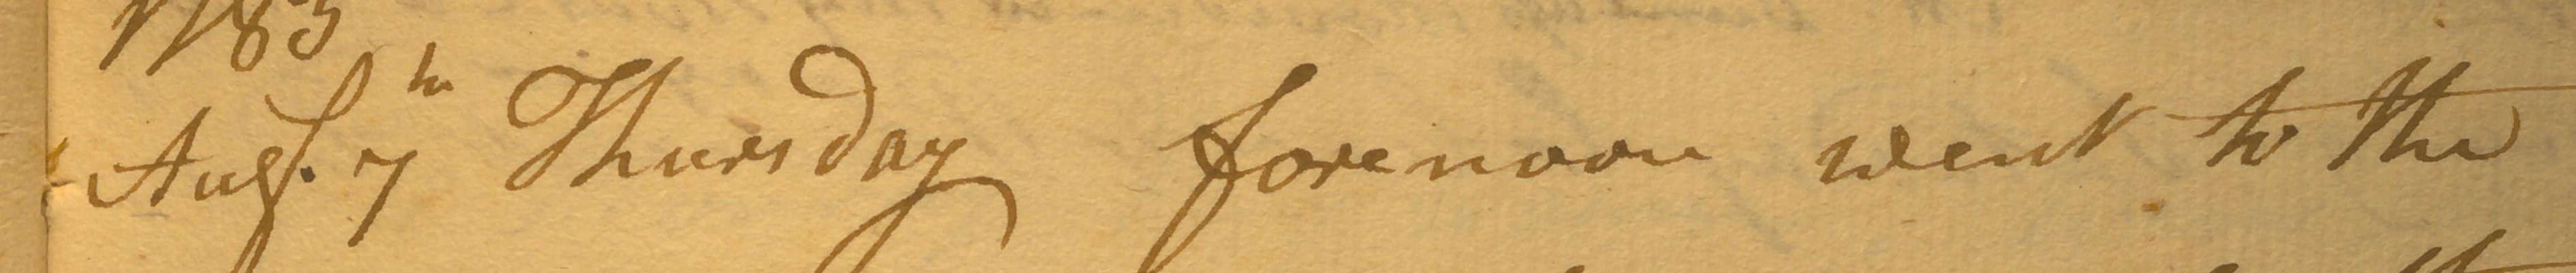Aug^t. 7 Thursday forenoon went to the
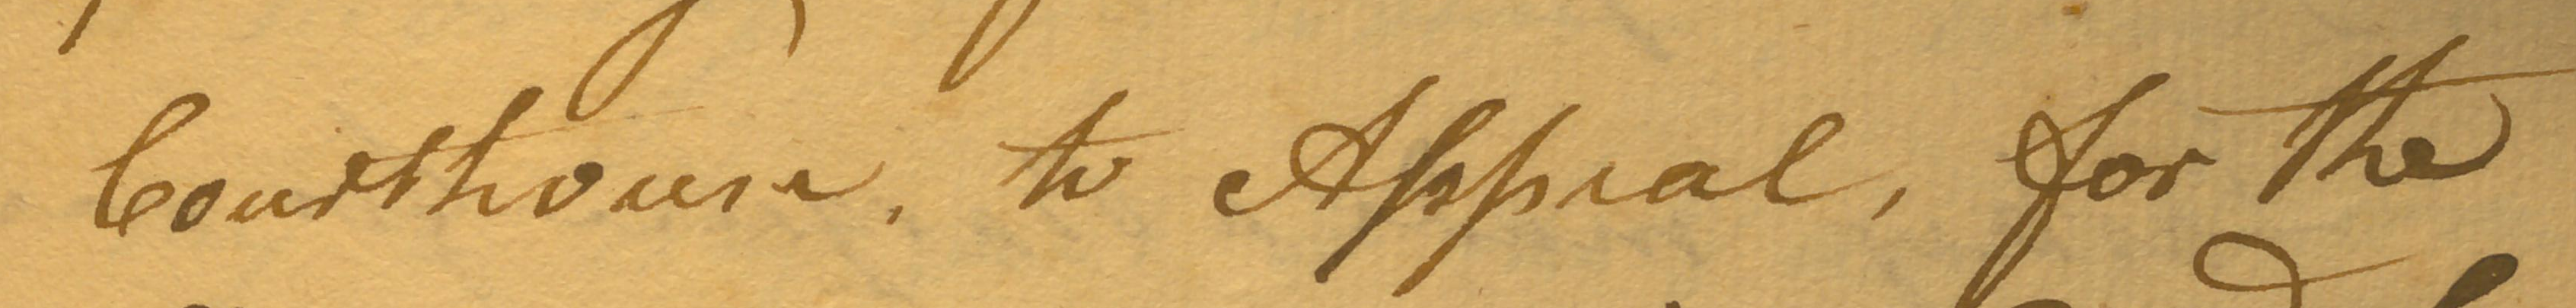Courthouse, to Appeal, for the
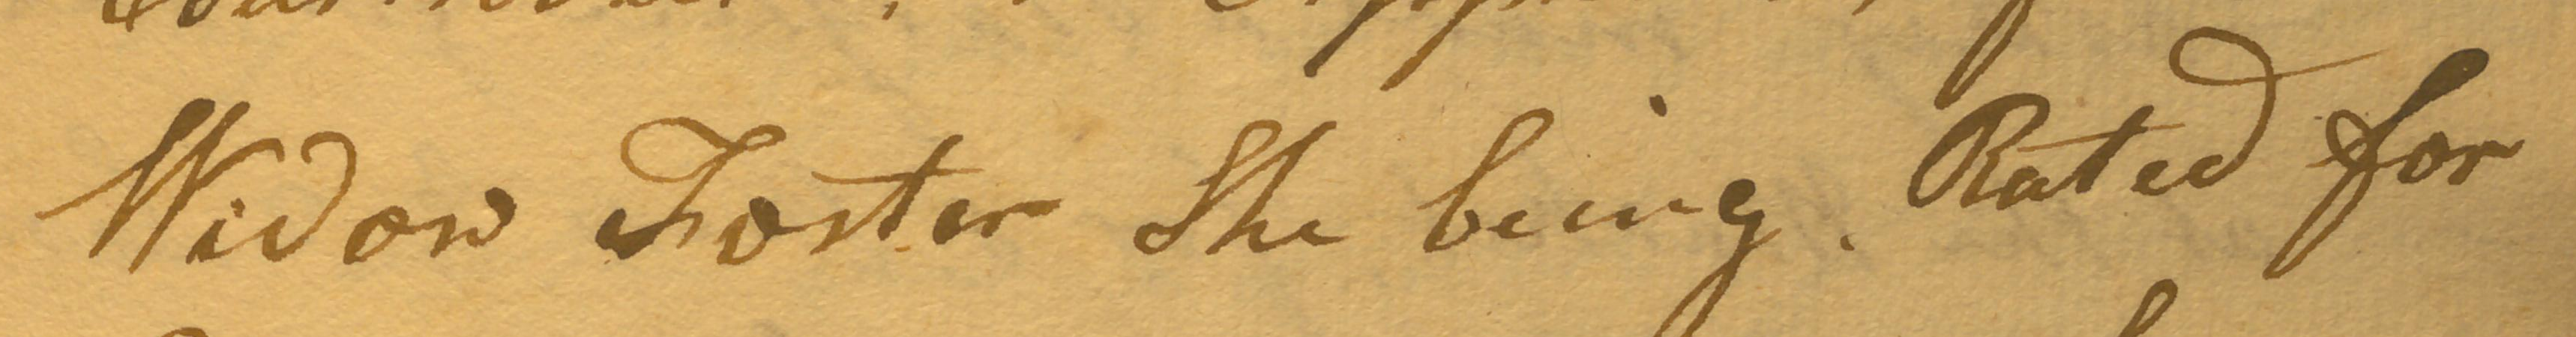Wedow Foster She being Rated for
